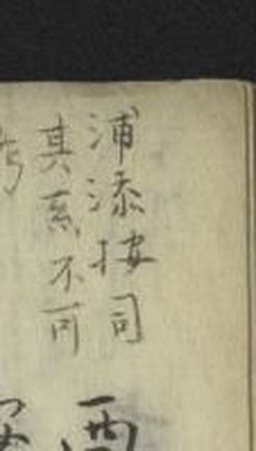浦添按司
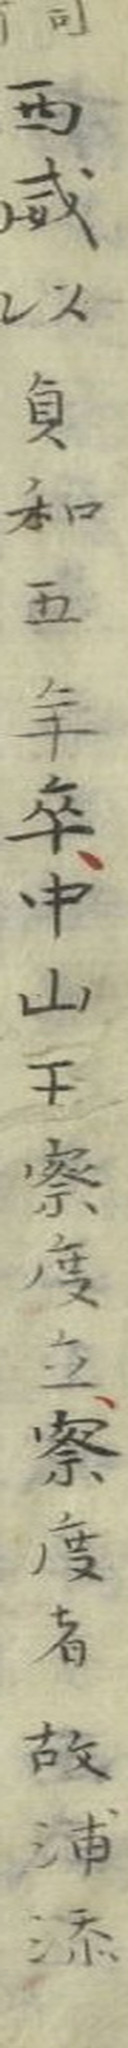西威以貞和五年卒、中山王察度立、察度者故浦添
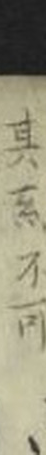其系不可
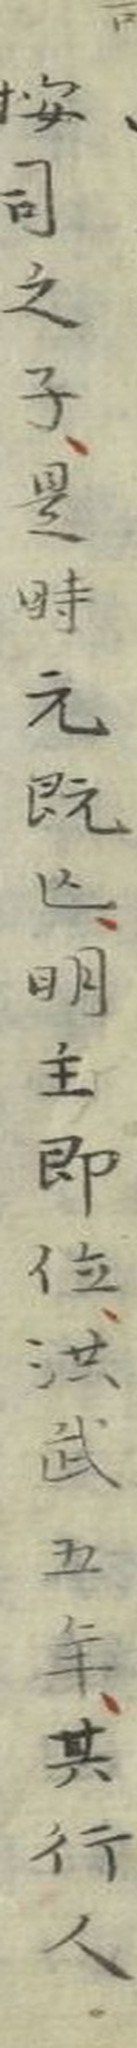按子之子、是時元既亡、明主即位、洪武五年、其行人
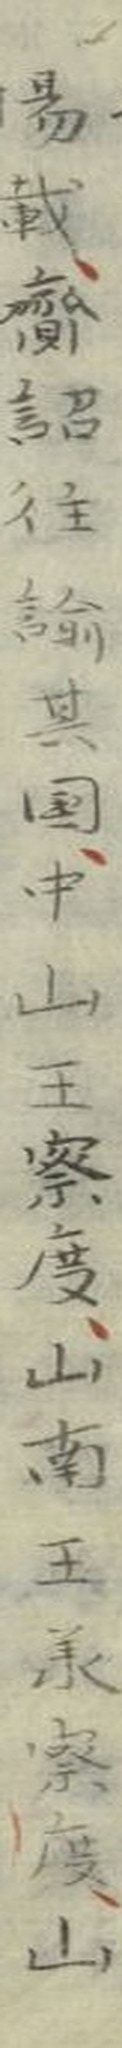揚載、齎詔往諭其国、中山王察度、山南王承察度、山
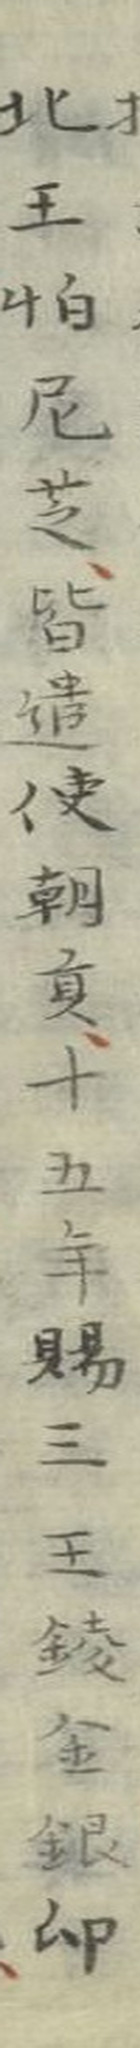北王帕尼芝、皆遣使朝貢、十五年賜三王錂金銀印
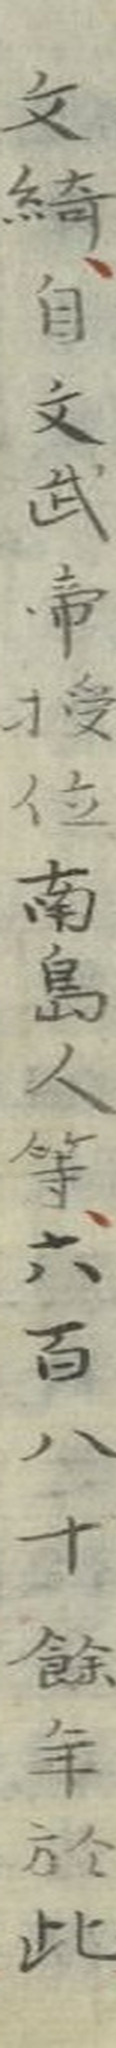文綺、自文武帝授位南島人等、六百八十余年於此、
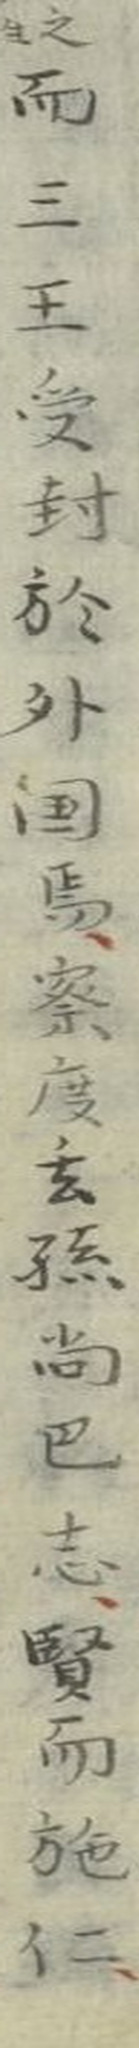而三王受封於外国焉、察度玄孫尚巴志、賢而施仁、
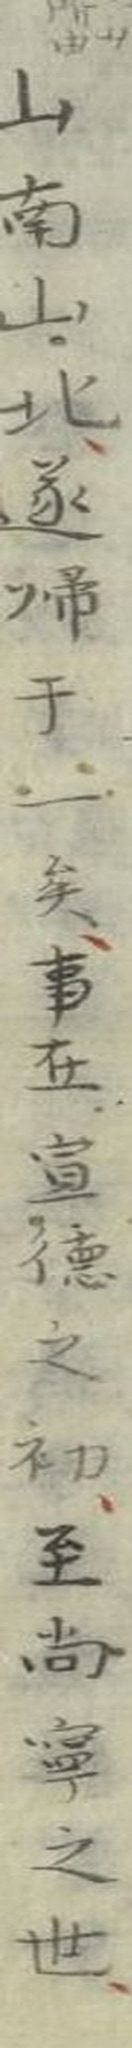山南山北、遂帰于一矣、事在宣徳之初、至尚寧之世、
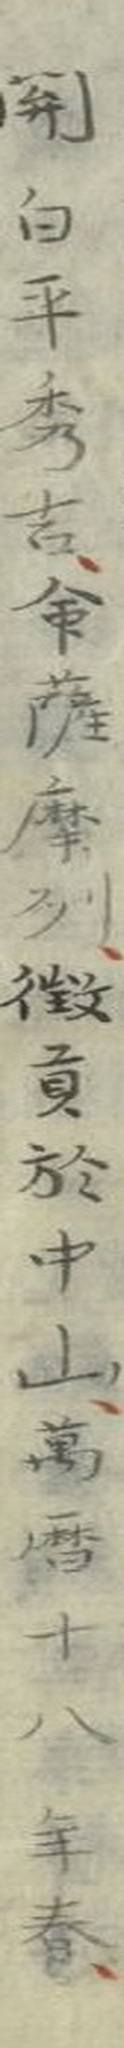関白平秀吉、命薩摩州、徴貢於中山、万暦十八年春、
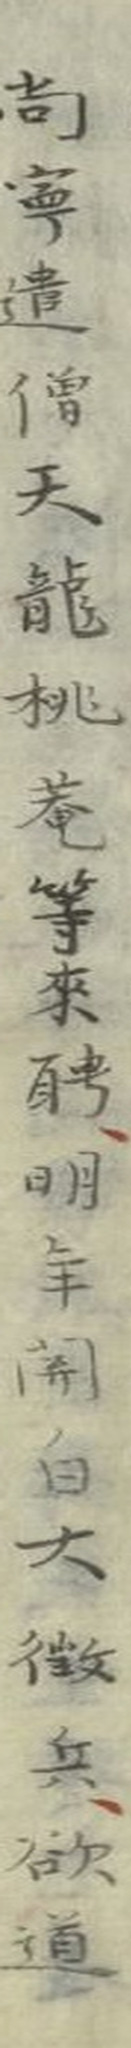尚寧遣僧天龍桃庵等来聘、明年関白大徵兵、欲道
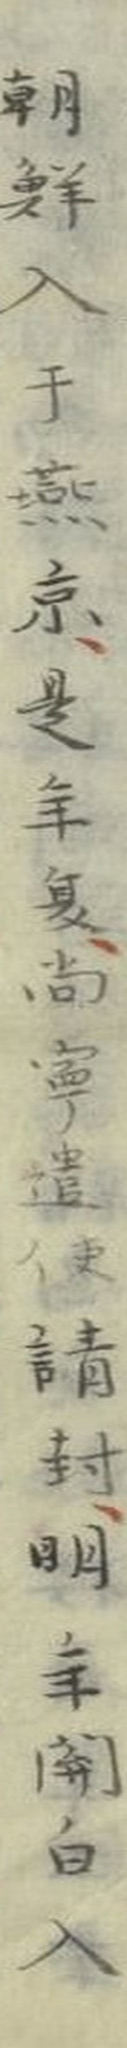朝鮮入于燕京、是年夏、尚寧遣使請封、明年関白入
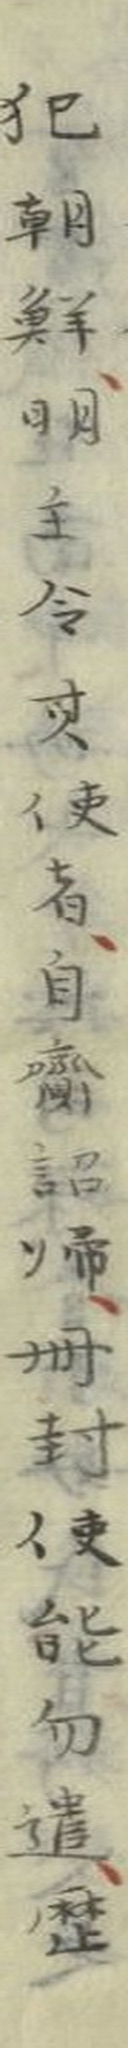犯朝鮮、明主令其使者、自齎詔帰、冊封使能勿遣、歷
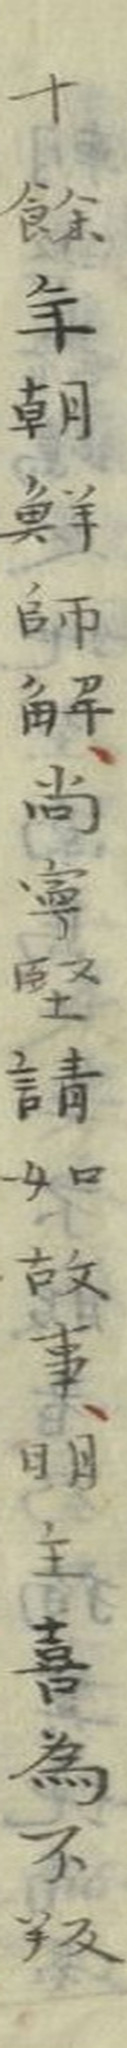十余年朝鮮師解、尚寧堅請如故事、明王喜為不叛
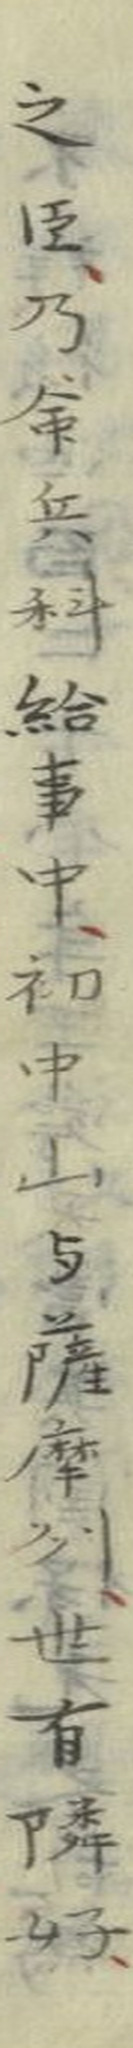之臣、乃命兵科給事中、初中山与薩摩州、世有隣好、
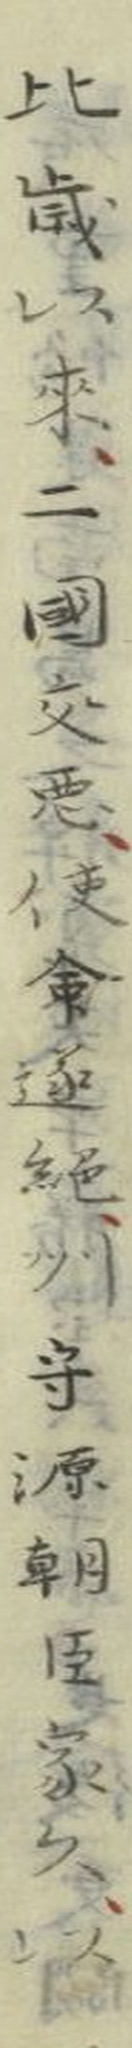比歳以来、二国交悪、使命遂絶、州守源朝臣家久、以
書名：琉球
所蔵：University of the Ryukyus Library
